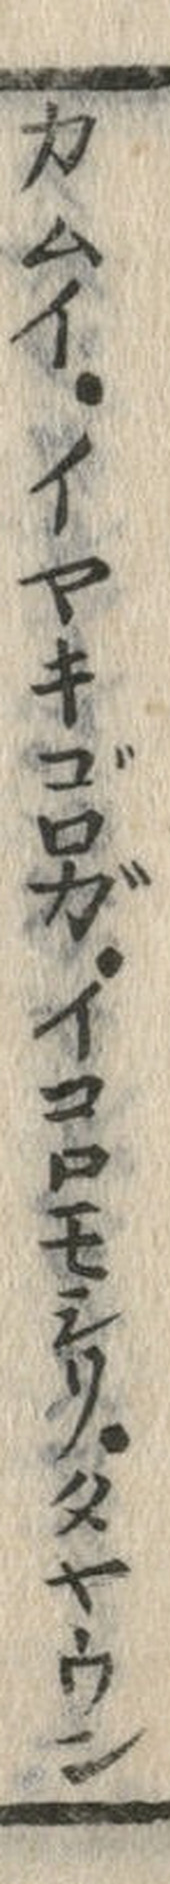カムイ。イヤキゴロガ。イコロモシリ。タヤウン
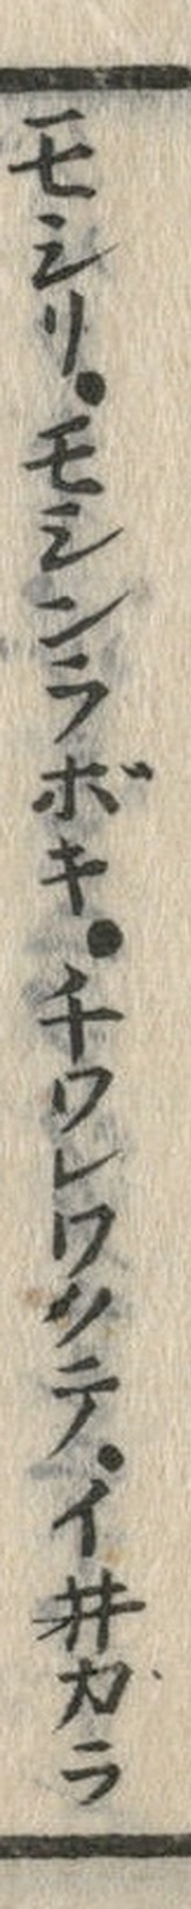モシリ。モシンラボキ。チワレワクテ。イヰカラ
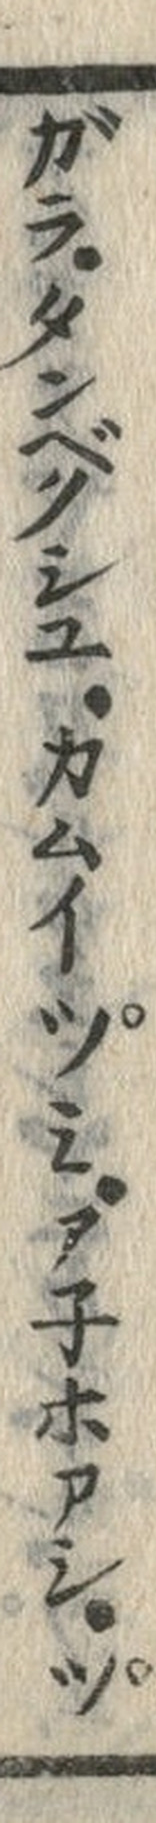ガラ。タンベクシユ。カムイツ゚ミ。アネホアシ。ツ゚
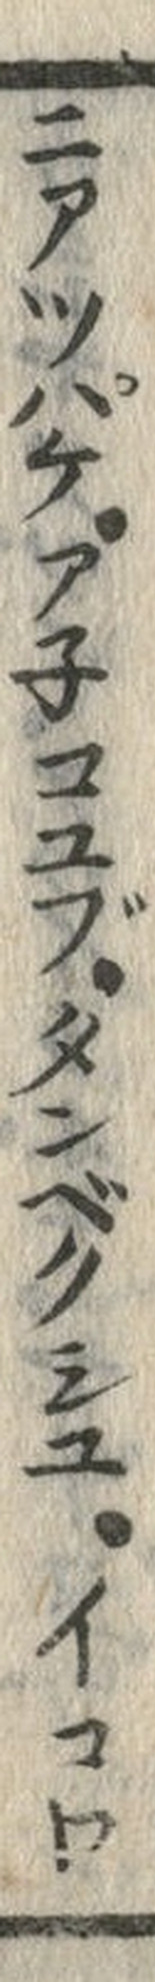ニアツパケ。アネコユブ。タンベクシユ。イコロ
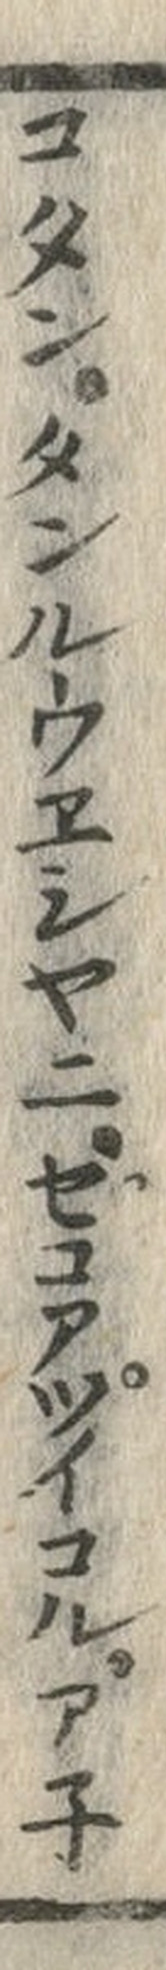コタン。タンルウヱシヤニ。セコアツ゚イコル。アネ

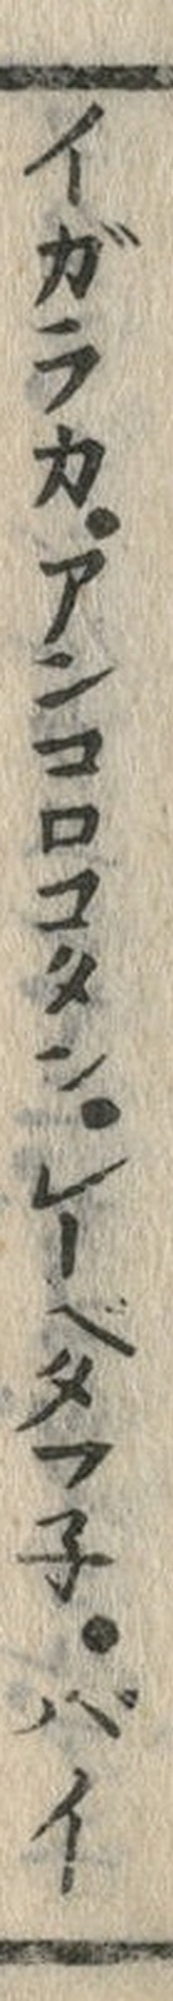イガラカ。アンコロコタン。レーペタフネ。バイ
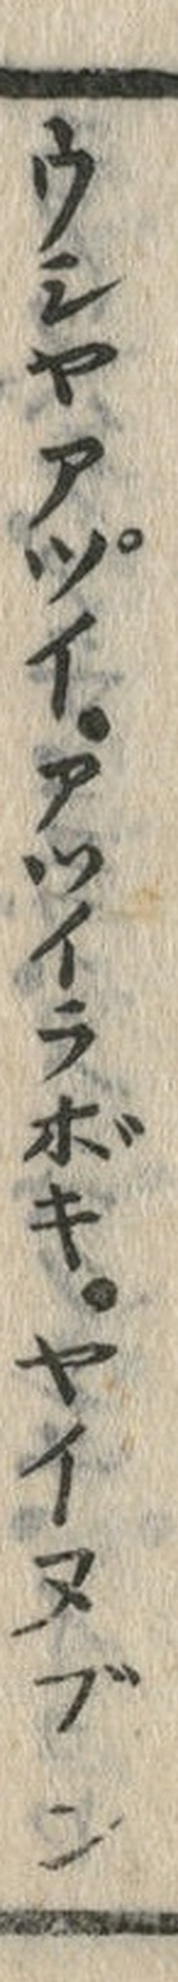ウシヤアツ゚イ。アツイラボキ。ヤイヌブン
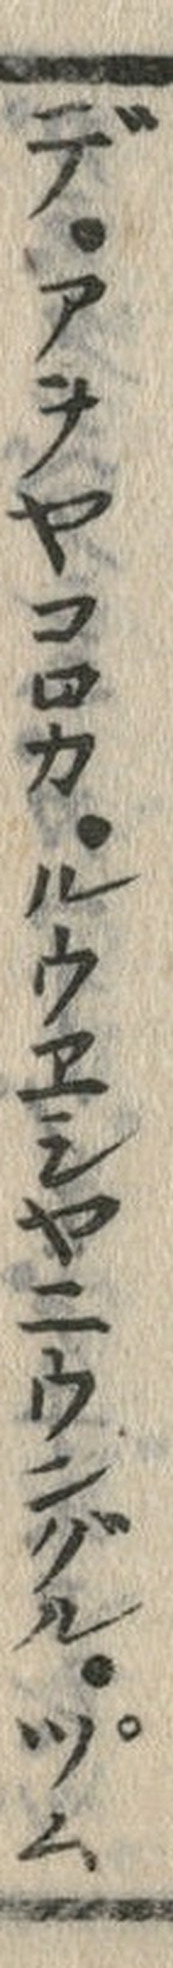デ。アヲヤコロカ。ルウヱシヤニウングル。ツ゚ムグ
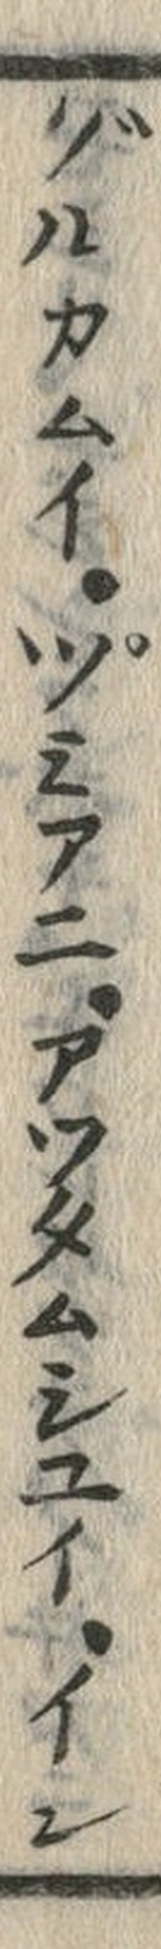ルカムイ。ツ゚ミアニ。アツタムシユイ。イシ
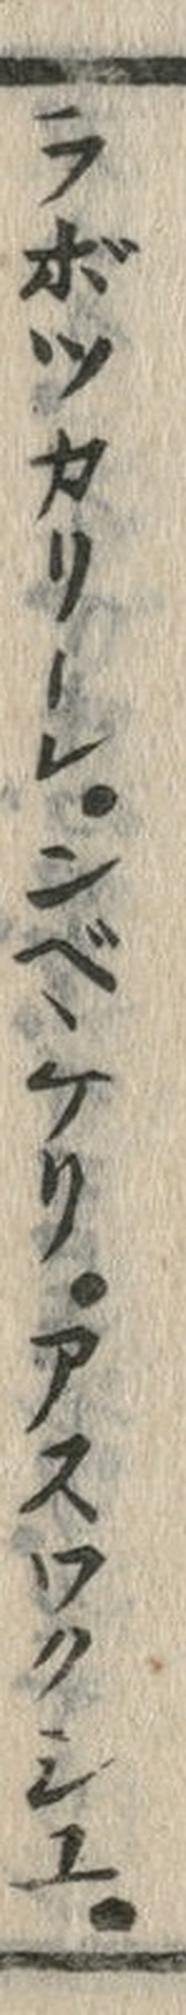ラボツカリーレ。ンベヽケリ。アスワクシユ。
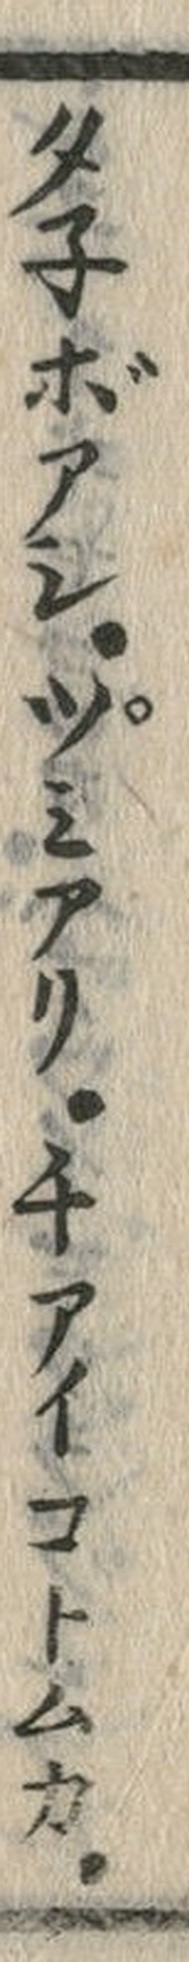タネボアシ。ツ゚ミアリ。チアイコトムカ。
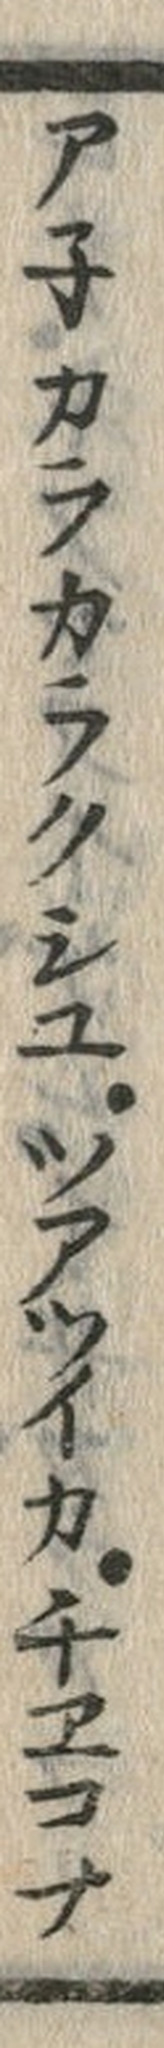アネカラカラクシユ。ツアツイカ。チヱコヲ
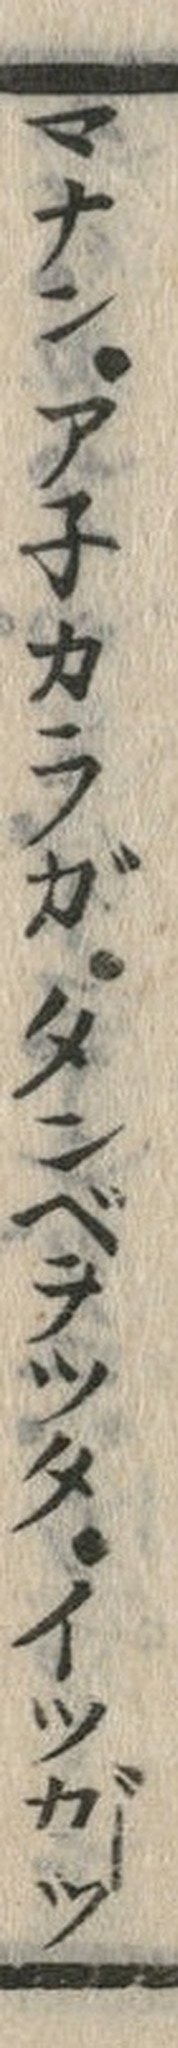マナン。アネカラガ。タンベヲツタ。イツガツ

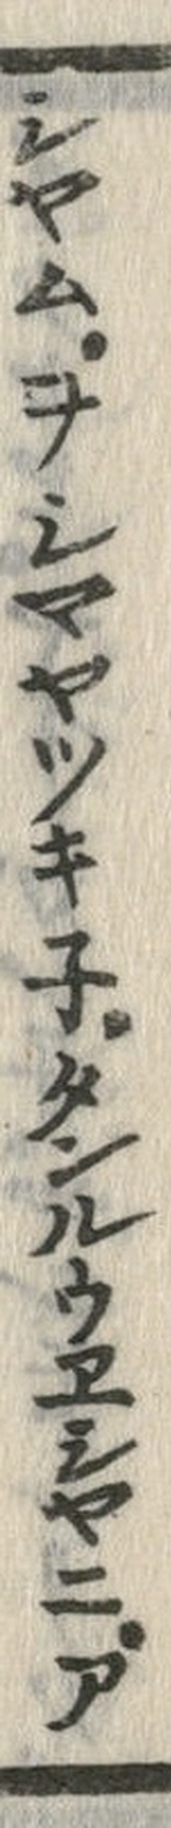シヤム。ヲシマヤツキネ。タンルウヱシヤニ。ア
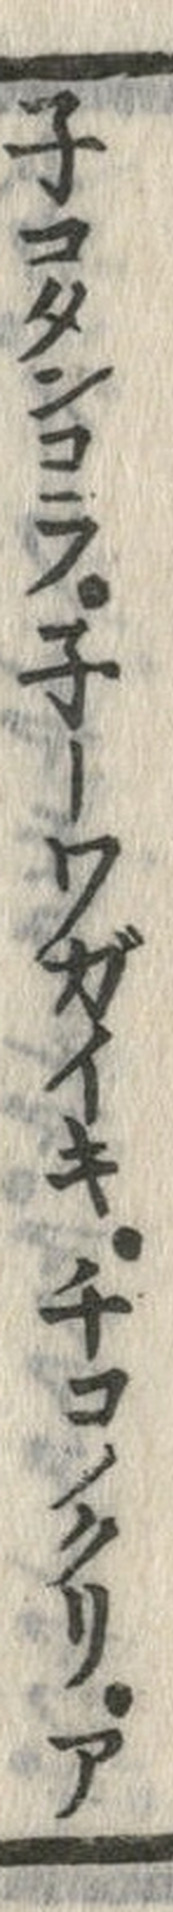ネコタンコラ。ネーワガイキ。チコノクリ。ア
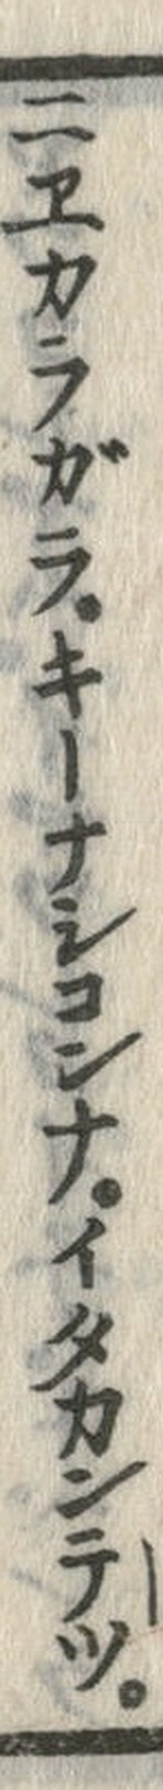ニヱカラガラ。キーナシコンナ。イタカンテツ。
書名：蝦夷方言藻汐草　坤巻
